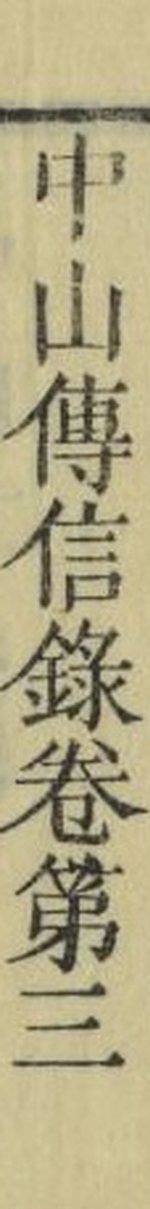中山伝信録巻第三

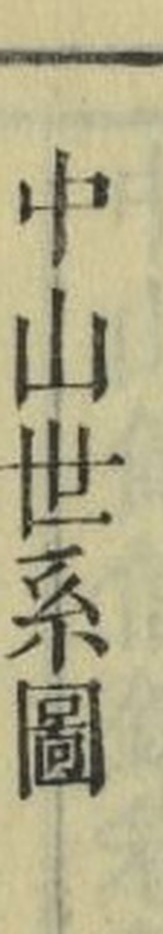中山世系図

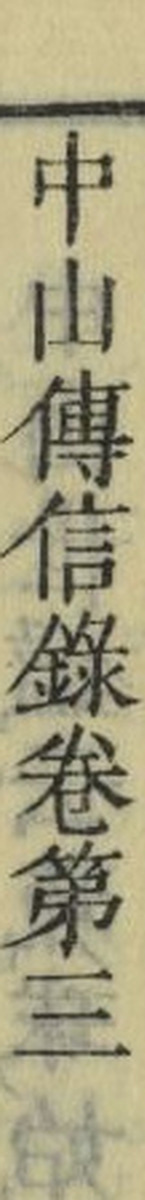中山伝信録巻第三
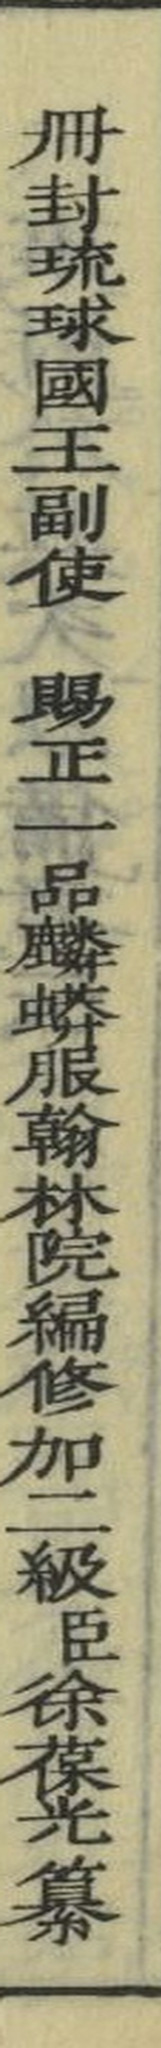冊封琉球国王副使賜正一品麟蟒服翰林院編修加二級臣徐葆光纂
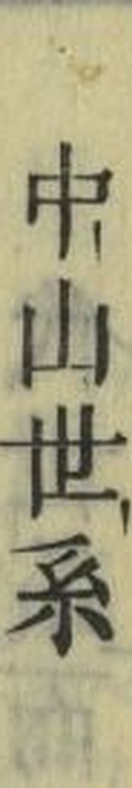中-山世-系

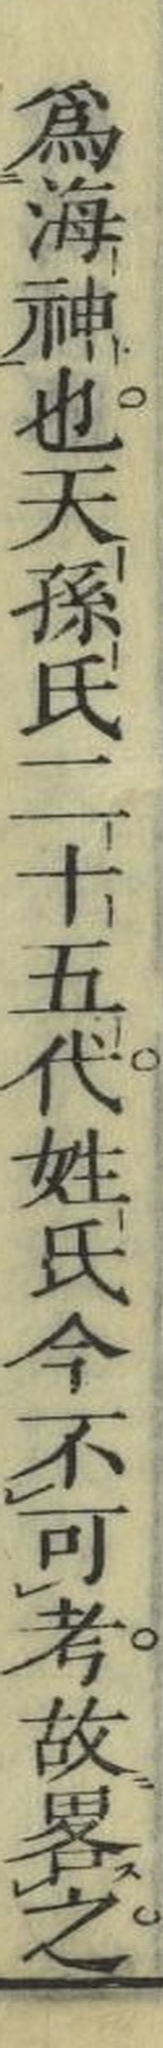為海-神也。天-孫-氏二-十-五-代。姓-氏今不可考。故略之。

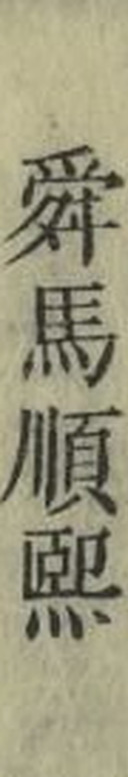舜馬順熙
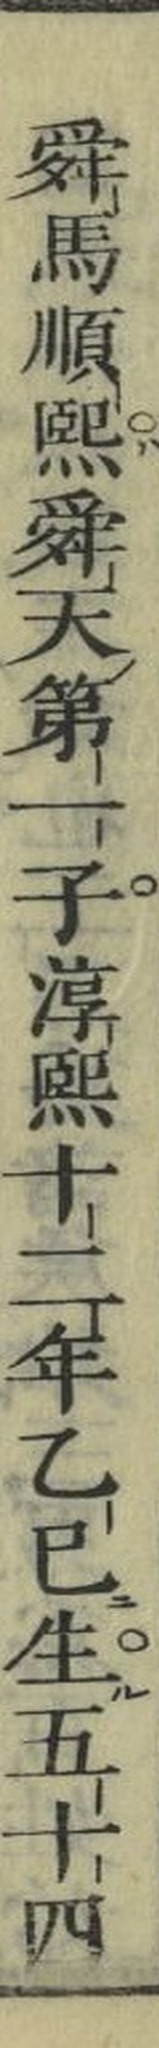舜-馬順-熙。舜-天第-一-子。淳-熙十-二-年乙-巳生。五-十-四
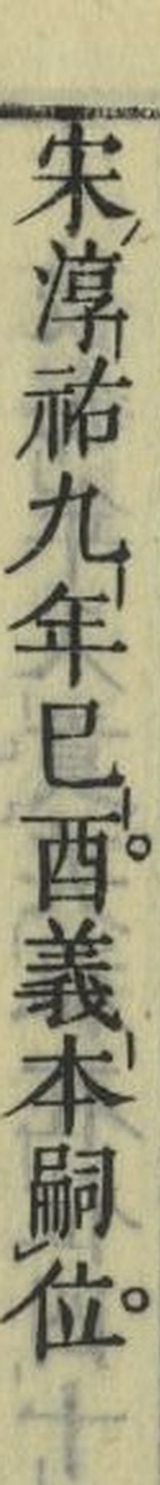宋淳-祐九-年巳-酉。義-本嗣位。

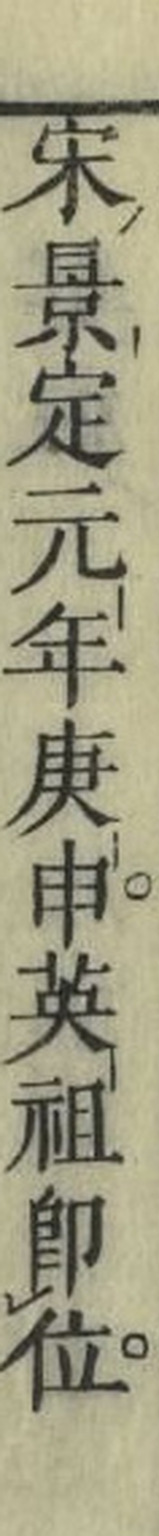宋景-定元-年庚-申。英-祖即位。
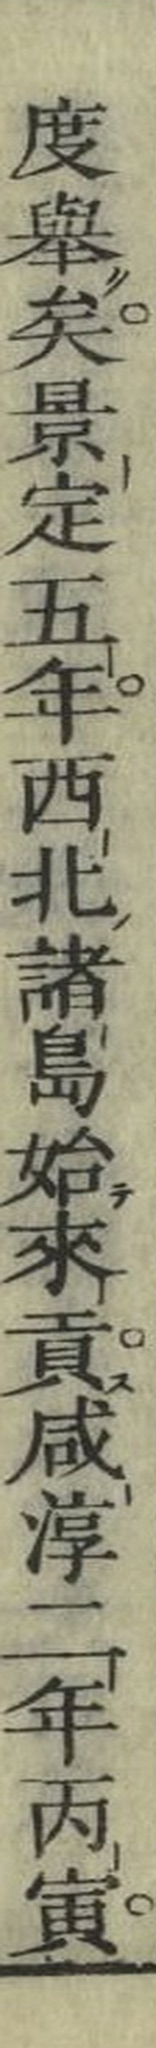度挙矣。景-定五-年。西-北諸-島始来-貢。咸-淳二-年丙-寅。
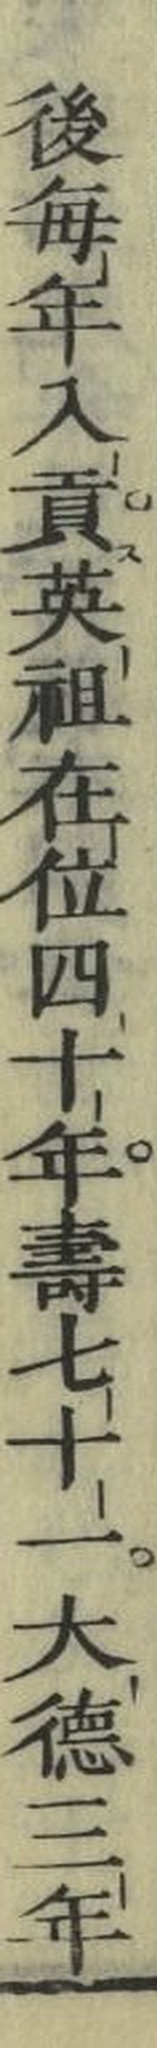後毎-年入-貢。英-祖在-位四-十-年。寿七-十-一。大-徳三-年
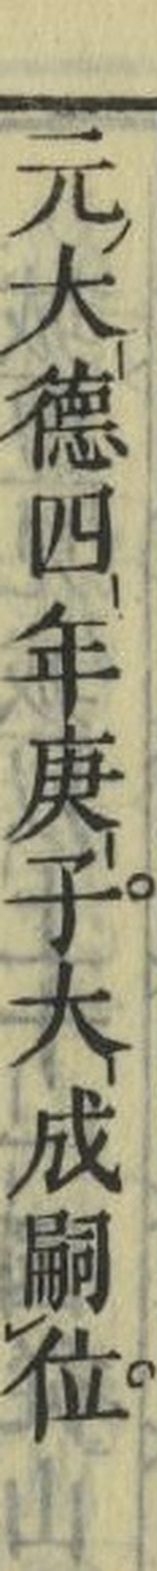元大-徳四-年庚-子。大-成嗣位。
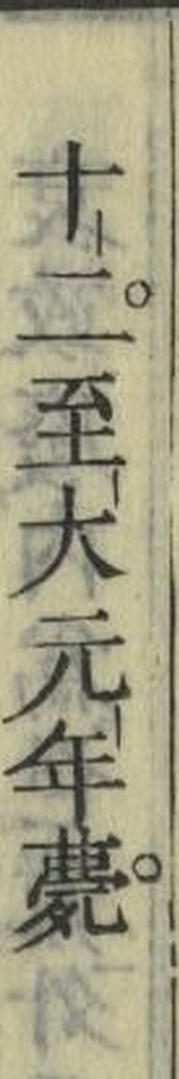十-二。至-大元-年薨。
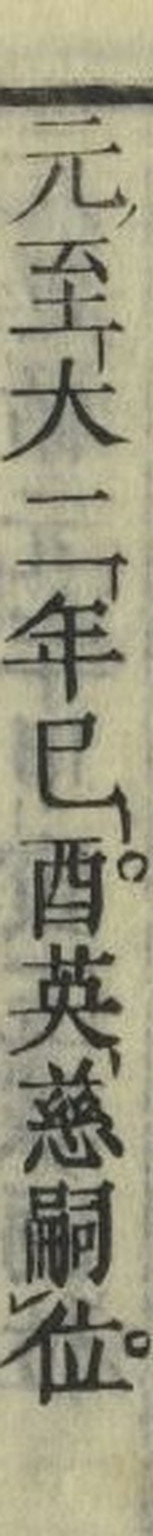元至-大二-年巳-酉。英-慈嗣位

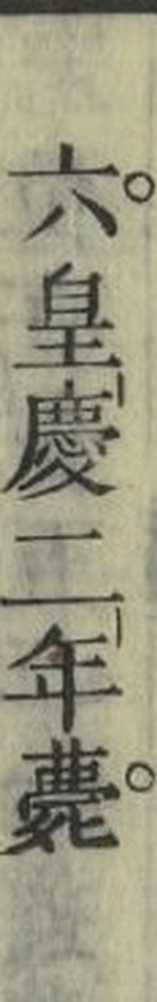六。皇-慶二-年薨。
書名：中山伝信録 巻三
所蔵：University of the Ryukyus Library
